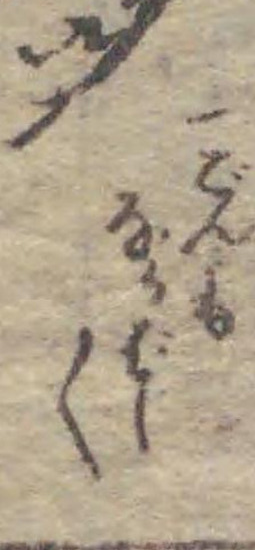なかばし
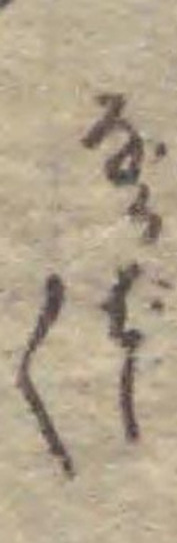なかばし

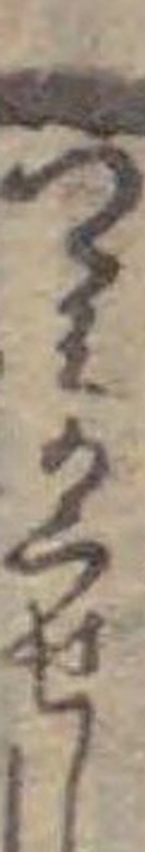つみかくせし
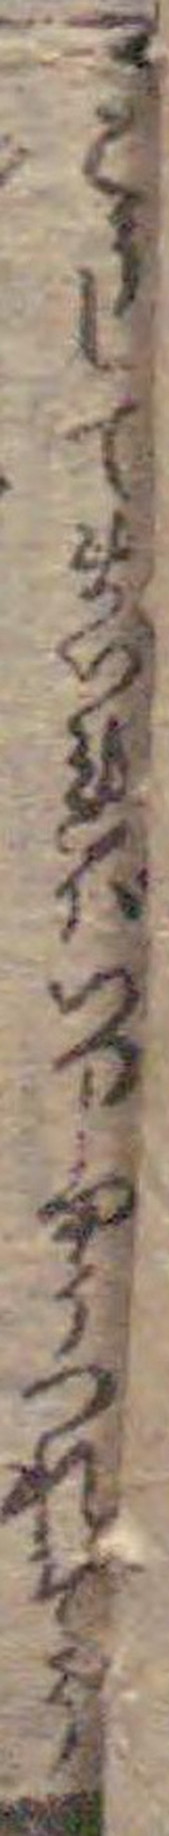こうしてまいれはいつしやうつれそう
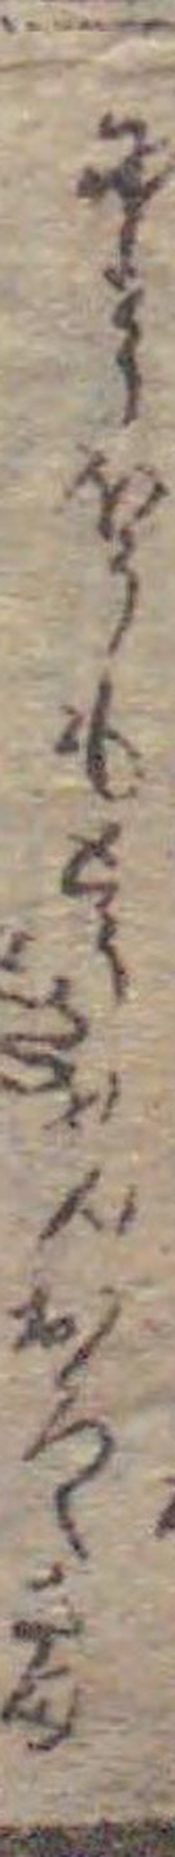にやうほうもとうせんおろくさま
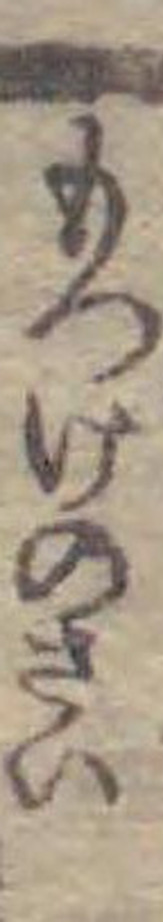もつけのさい
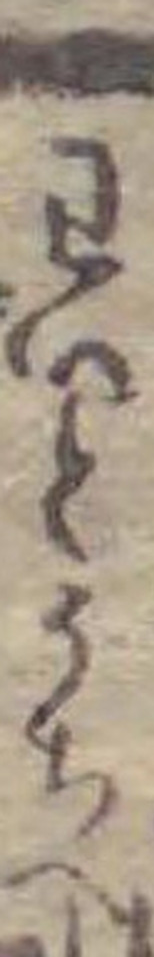わいとうちへ
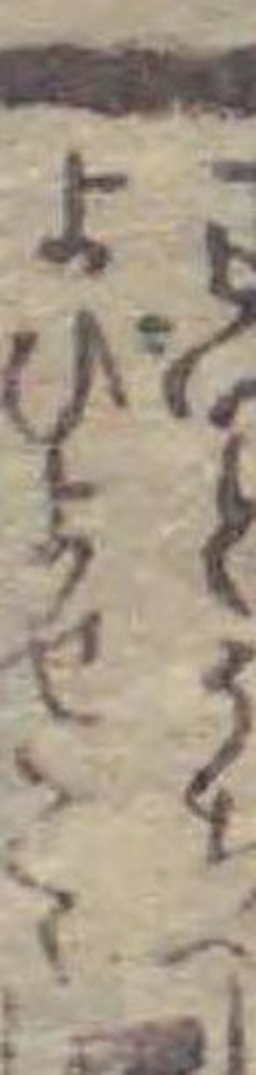よびよせこゝ
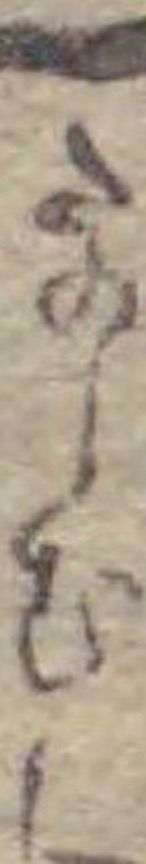たのしむ
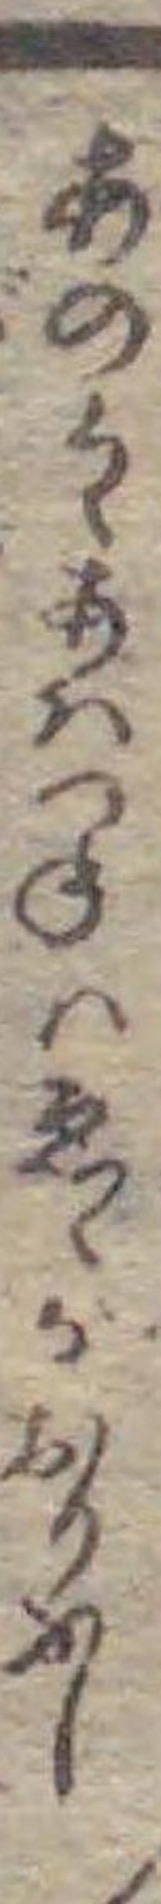あのかゝあはつねはゑゝがおりふし
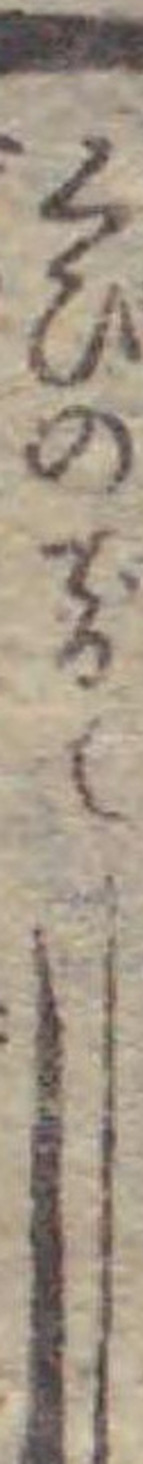くびのでる
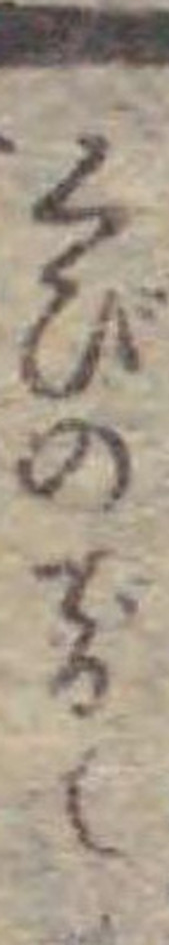くびのでる
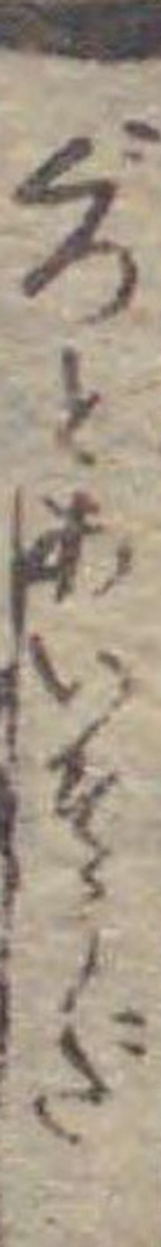ぐつとあいそうだ
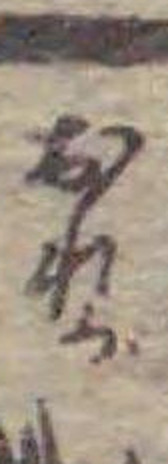おれが
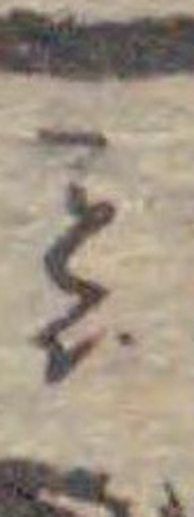ことは
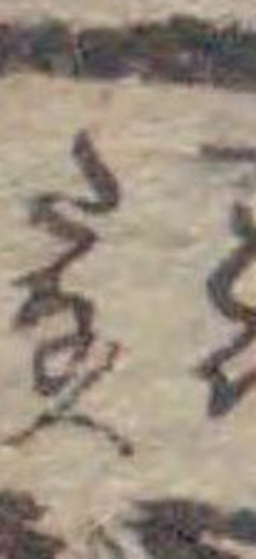たなへ
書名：[化物一代記] : 5巻
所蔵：国立国会図書館 National Diet Library, JAPAN
